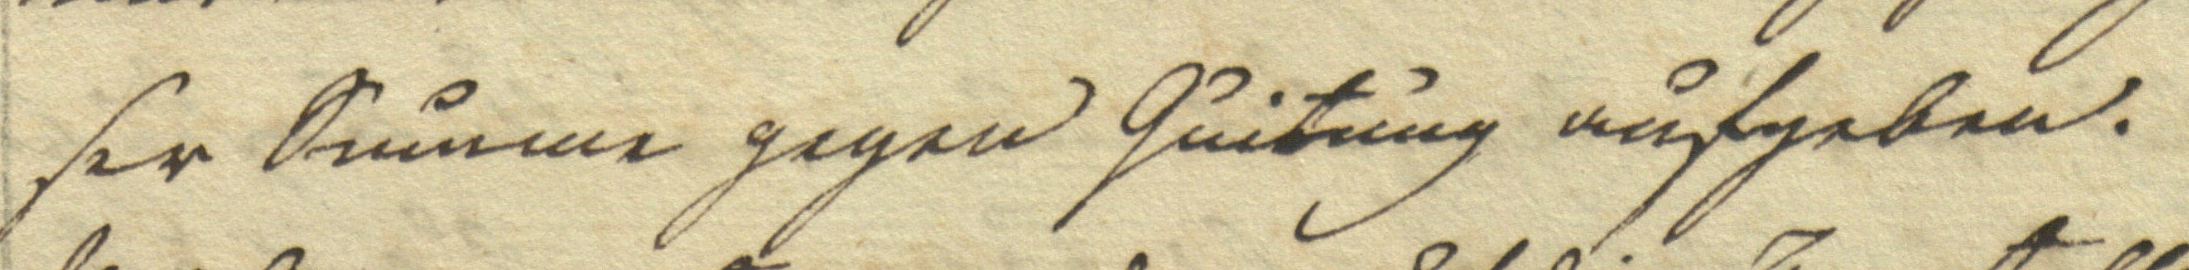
ser Summe gegen Quitung aufgeben.
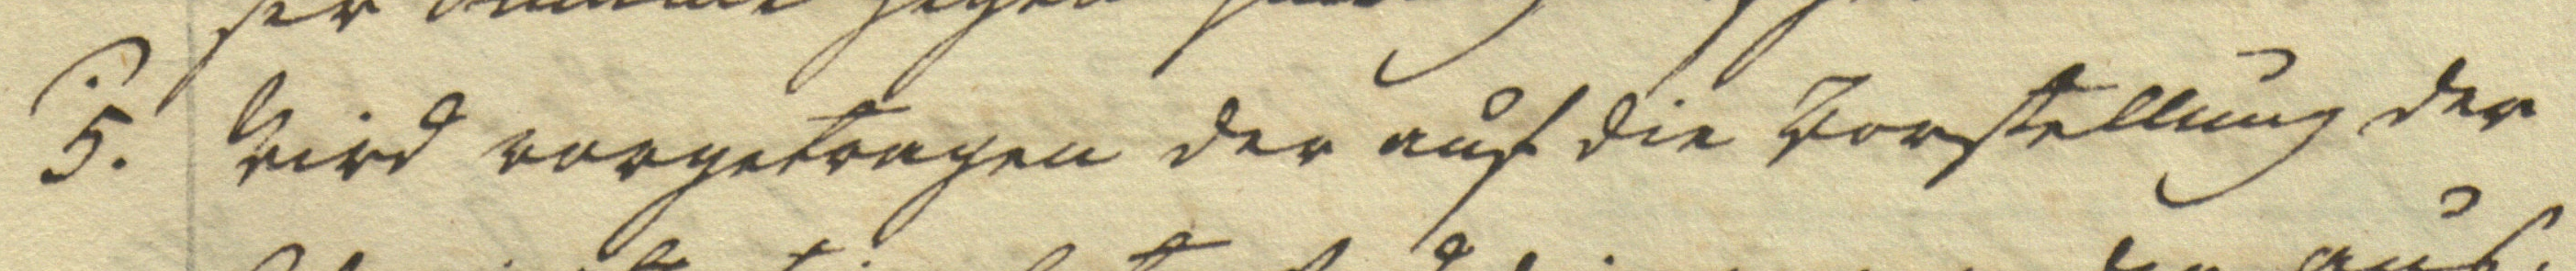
5. Wird vorgetragen der auf die Vorstellung der
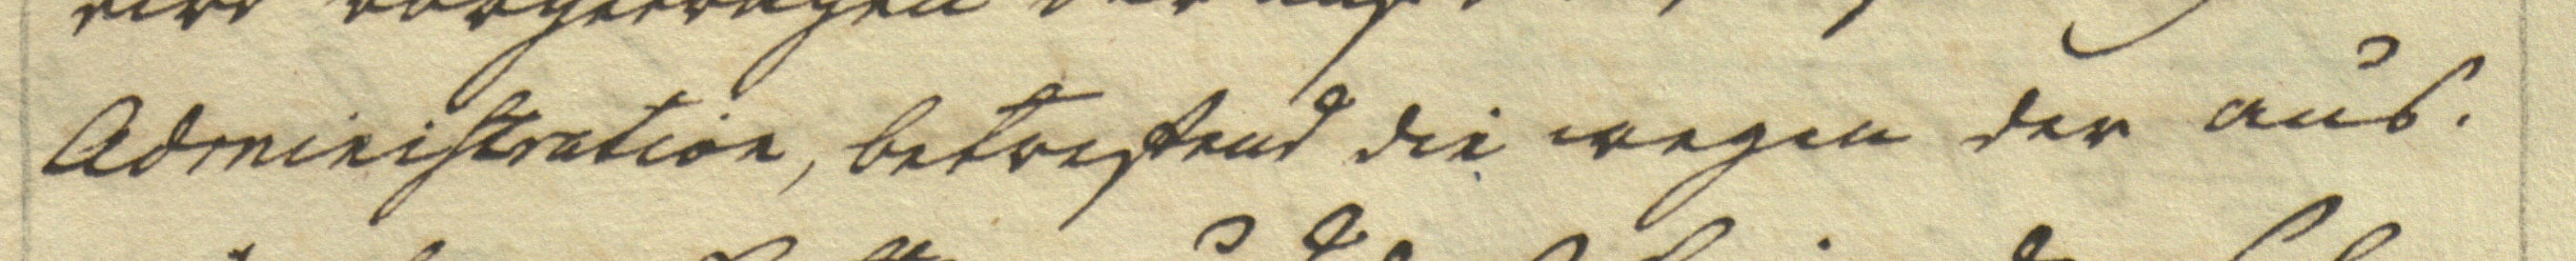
Administration, betreffend die wegen der aus¬
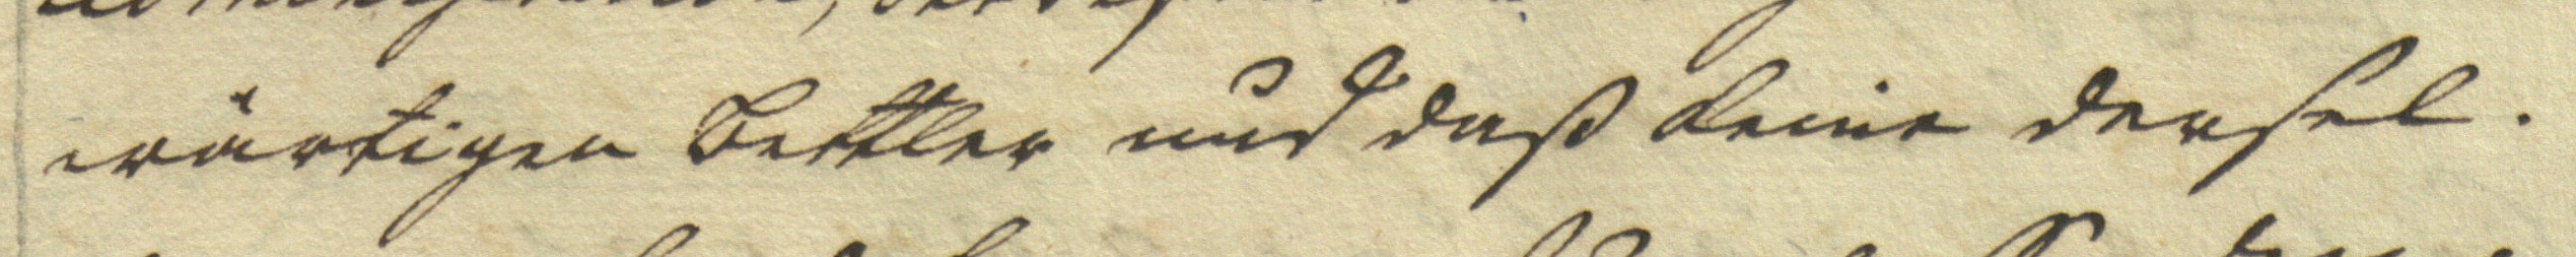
wärtigen Bettler und daß keine dersel¬
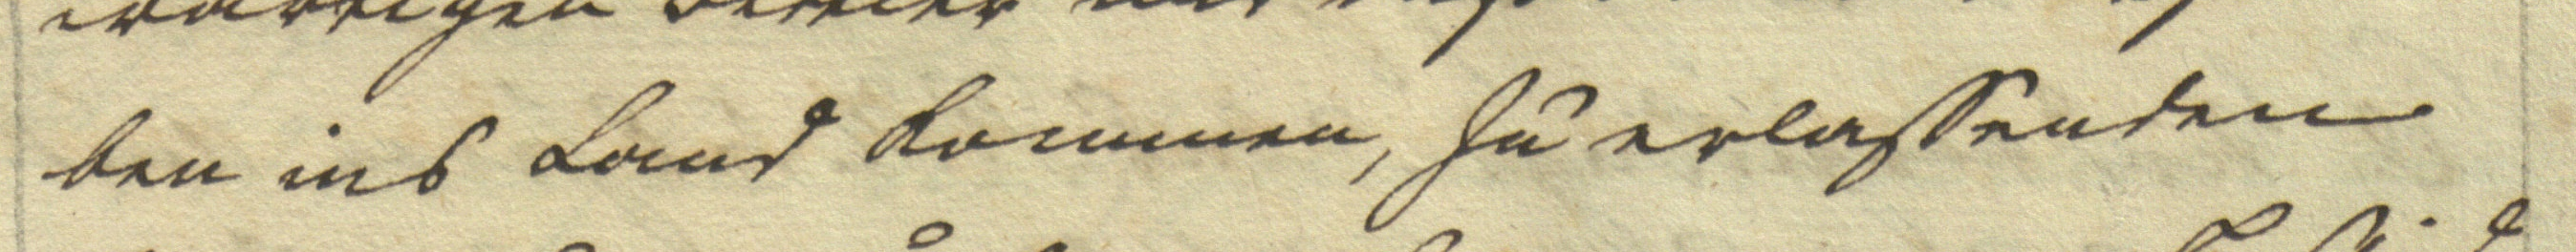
ben ins Land kommen, zu erlassenden
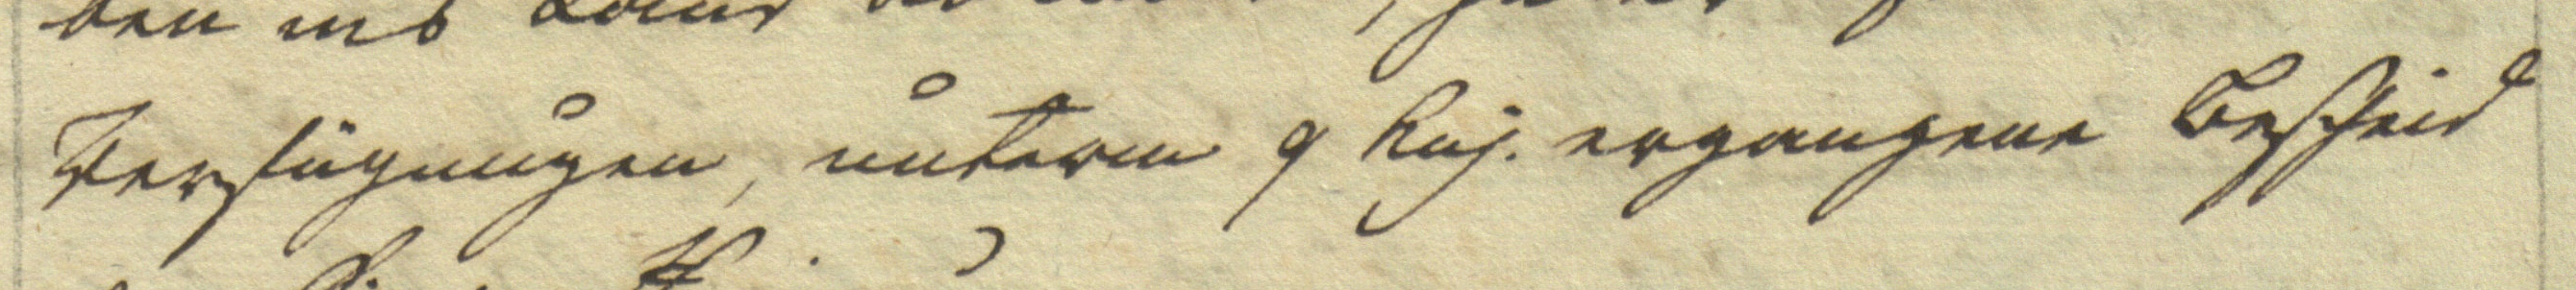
Verfügungen, unterm 9 huj. ergangene Bescheid
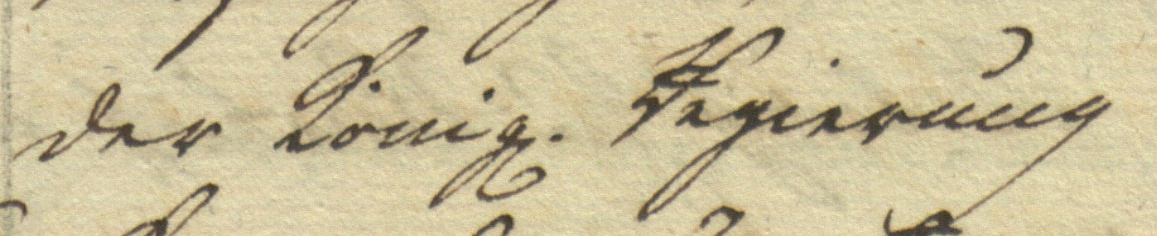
der Königl. Regierung
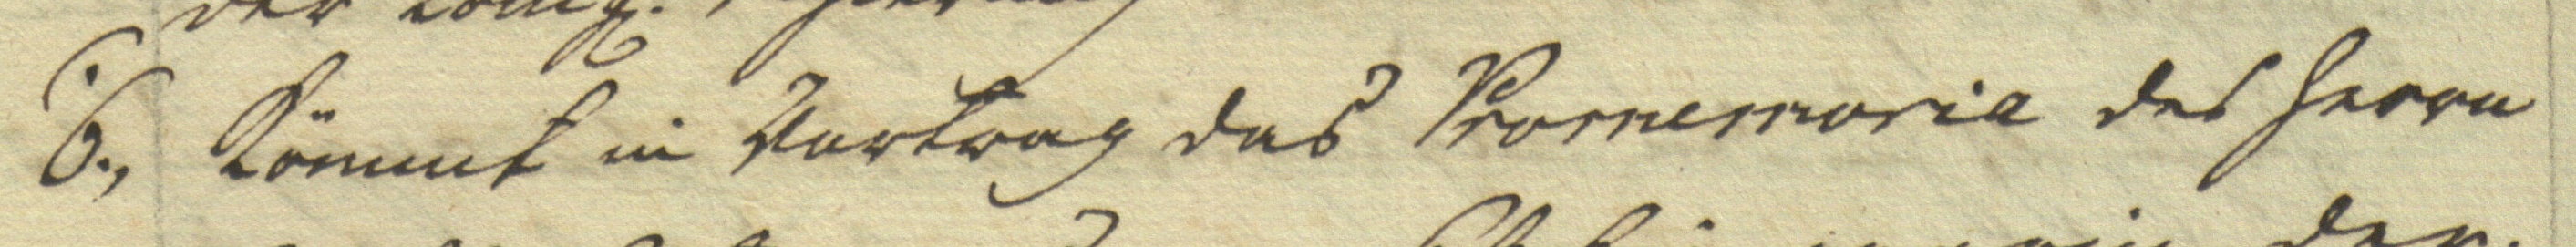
6., Kommt in Vortrag das Promemoria des Herrn
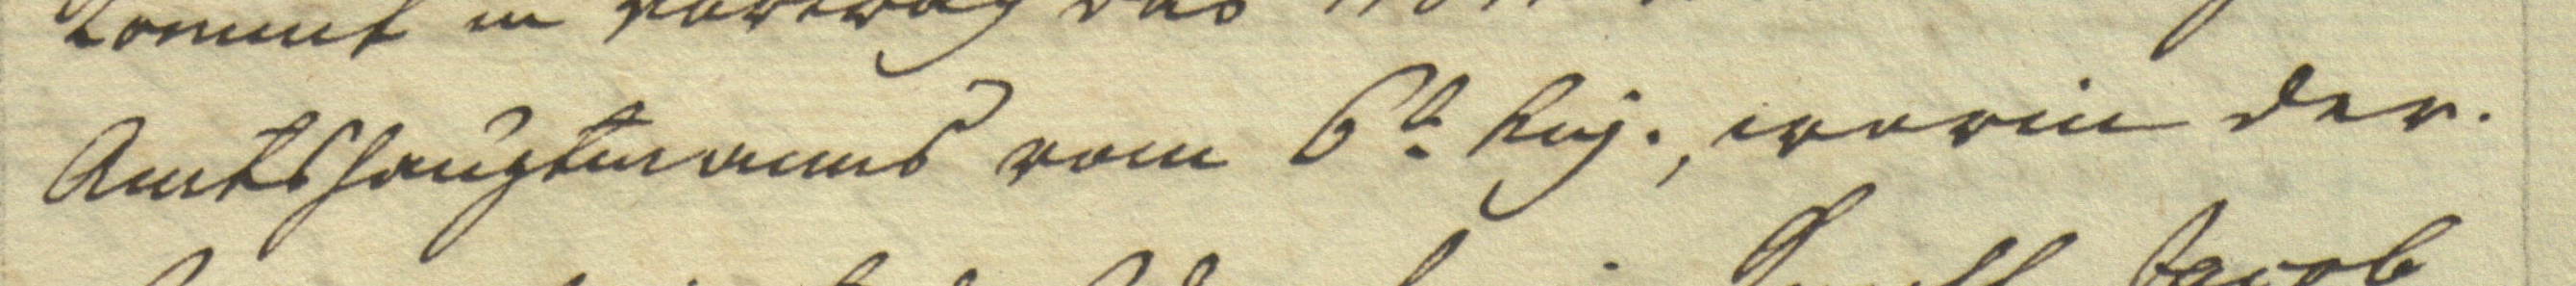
Amtshauptmanns vom 6 te huj., worin der¬
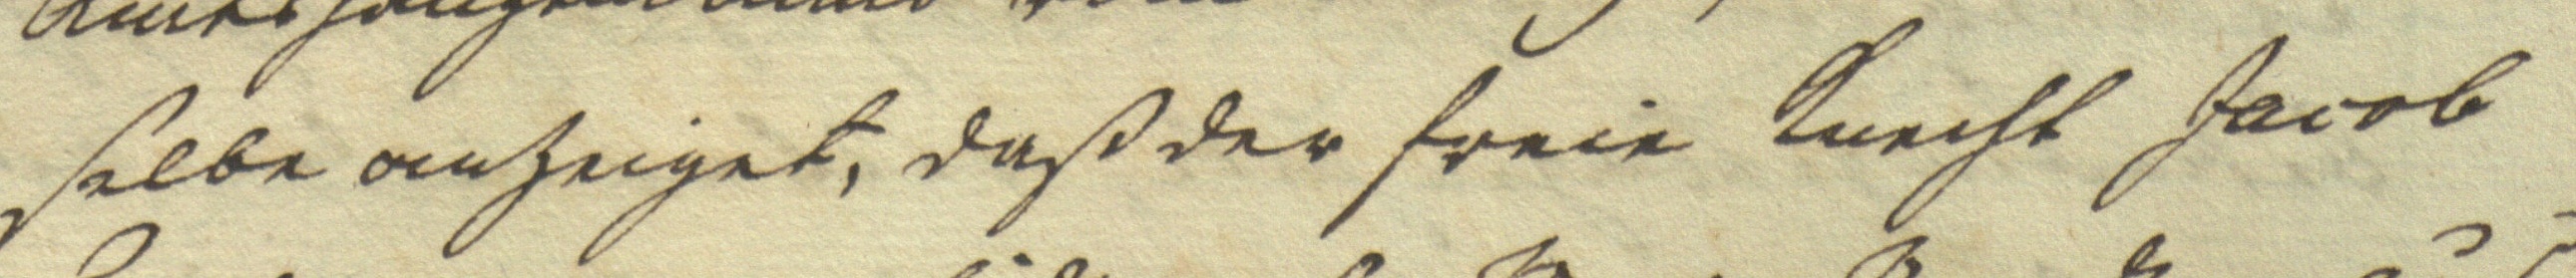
selbe anzeiget, daß der freie Knecht Jacob
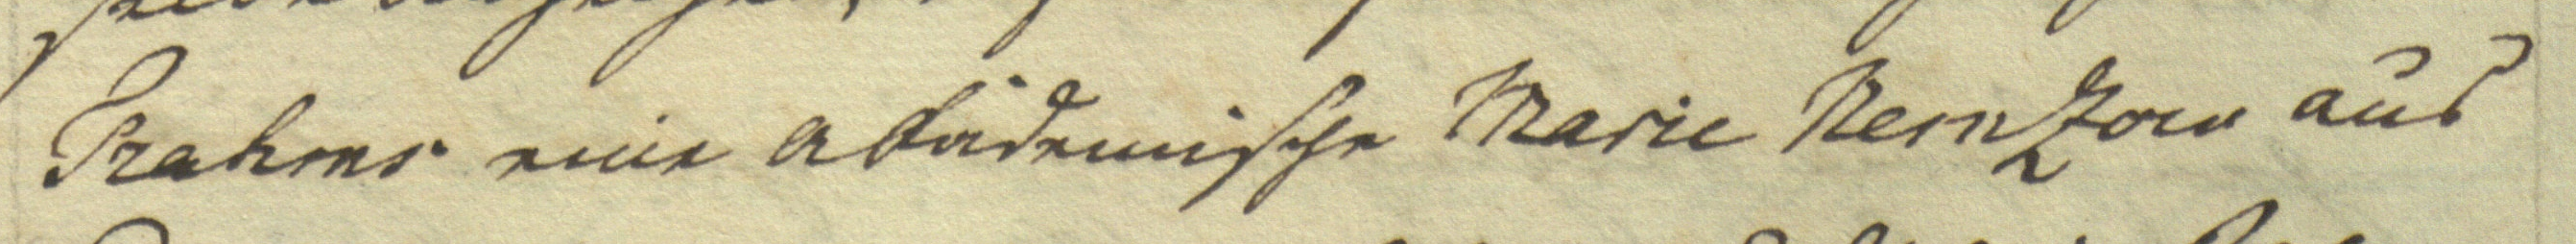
Trahms eine akademische Marie Nemzow aus
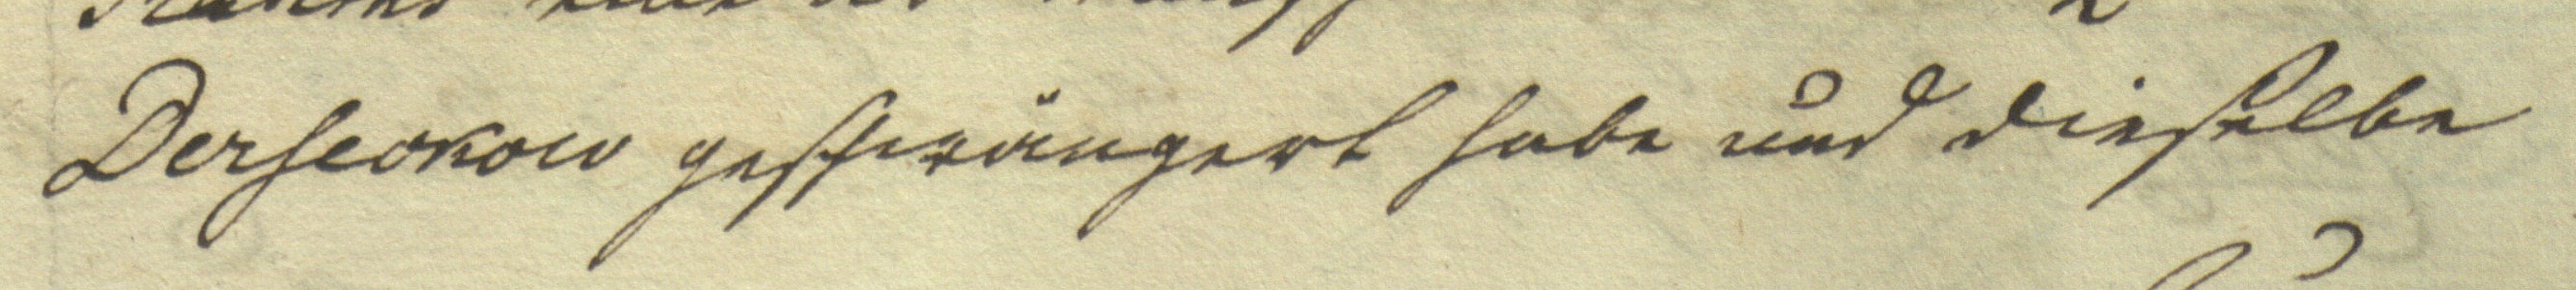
Derseckow geschwängert habe und dieselbe
